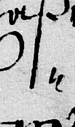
s¬
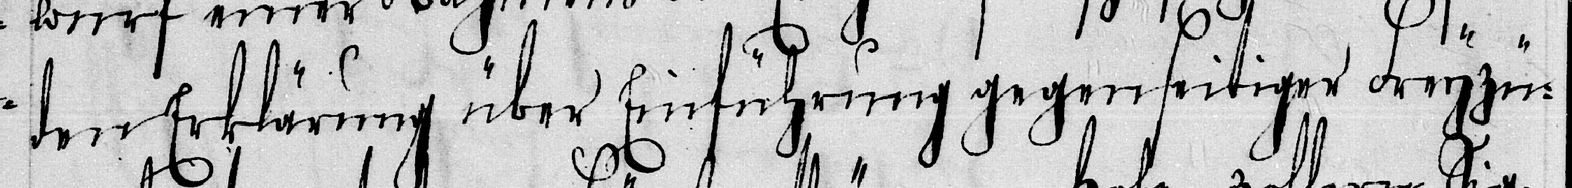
den Erklärung über Einführung gegenseitiger Freyzü¬
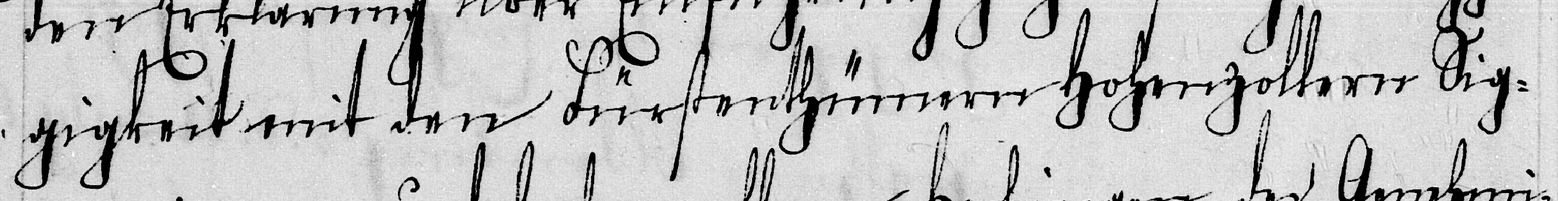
gigkeit mit den Fürstenthümern Hohenzollern Sig¬
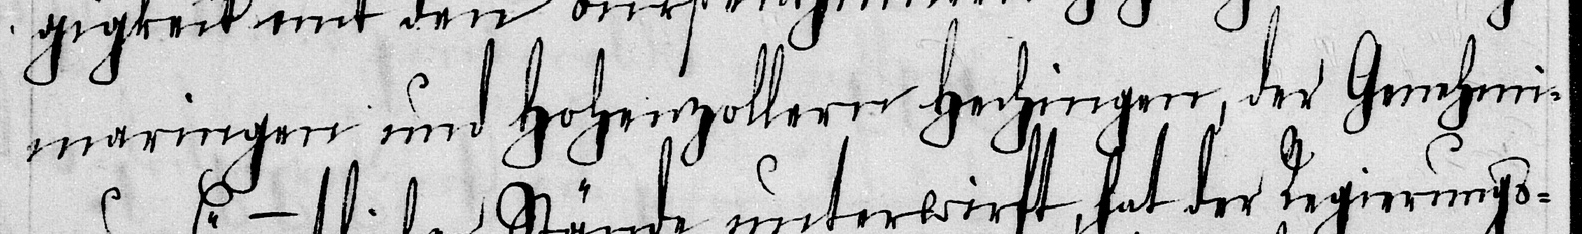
maringen und Hohenzollern Hechingen, der Genehmi¬
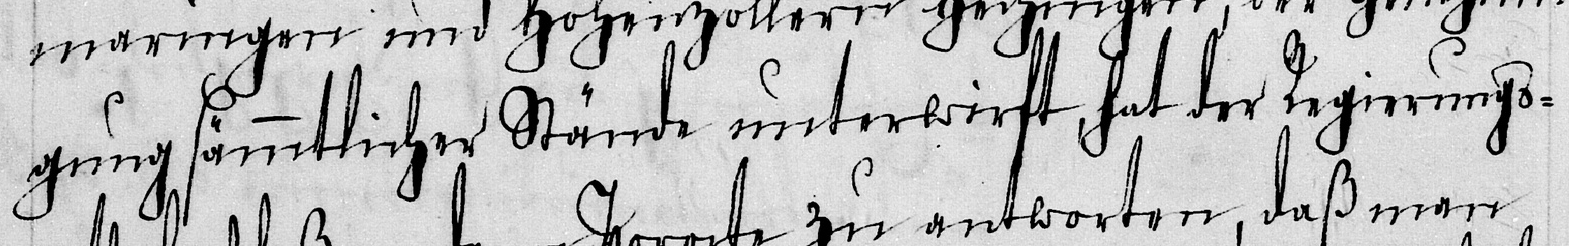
gung sämmtlicher Stände unterwirft, hat der Regierungs¬
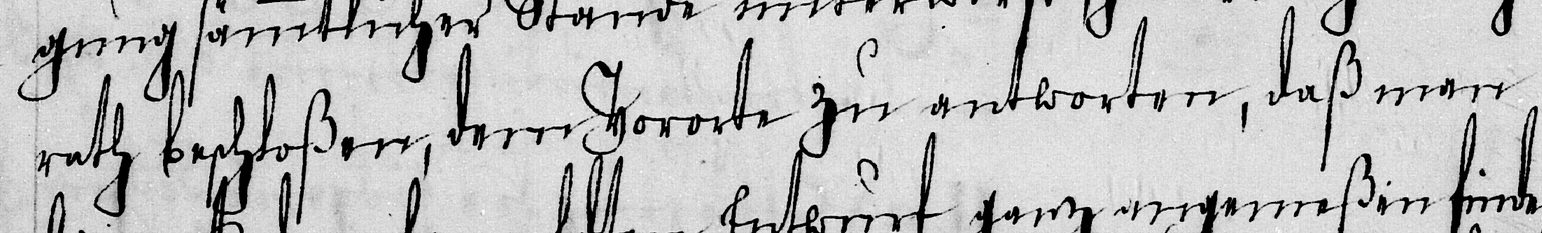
rath beschloßen, dem Vororte zu antworten, daß man
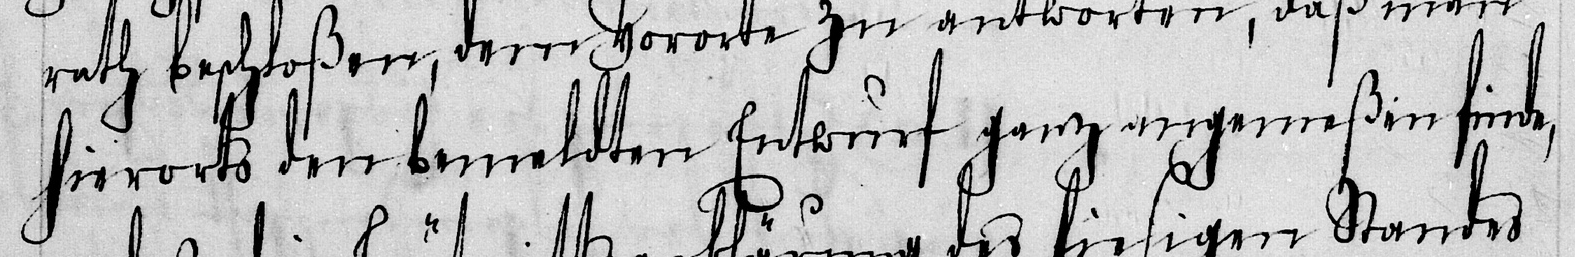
hierorts den bemeldten Entwurf ganz angemeßen finde,
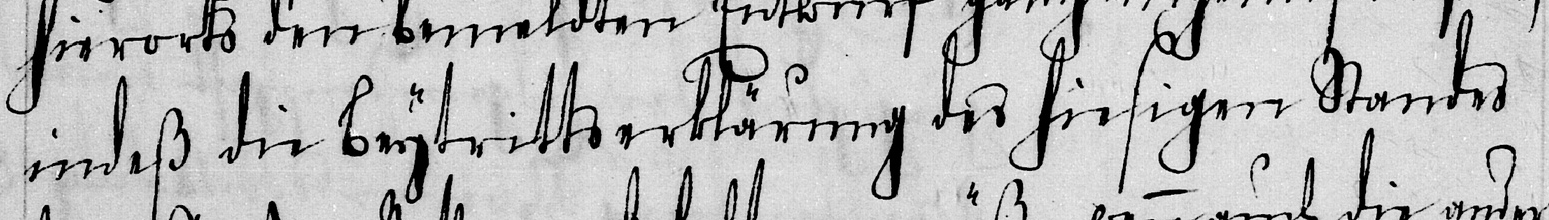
indeß die Beytrittserklärung des hiesigen Standes
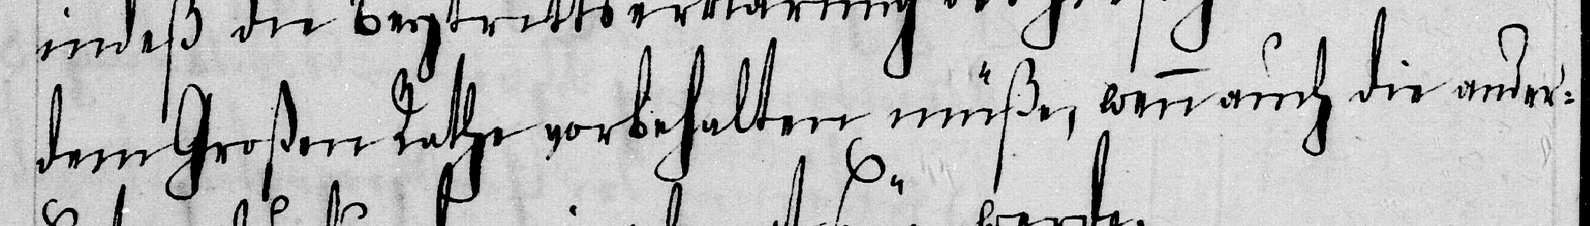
dem Großen Rathe vorbehalten müße, wenn auch die ander¬
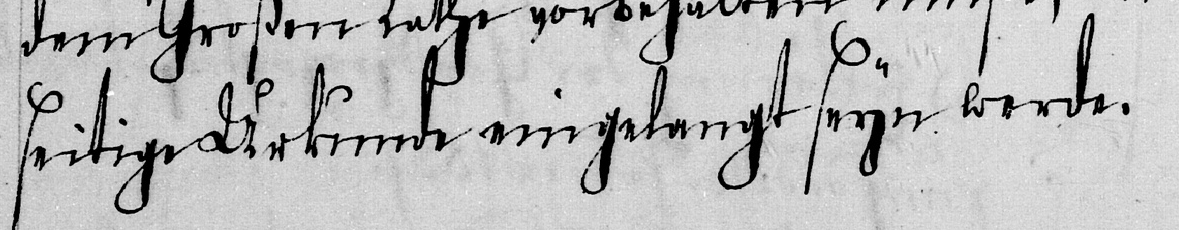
seitige Urkunde eingelangt seyn werde.
